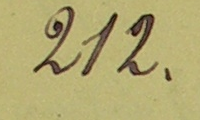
212
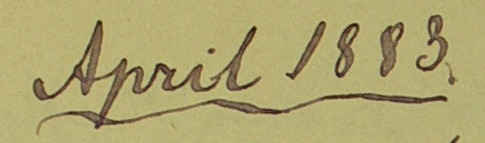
April 1883
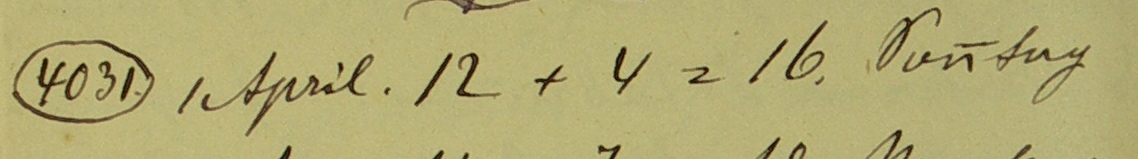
4031 1. April = 12 + 4 = 16. Sonntag
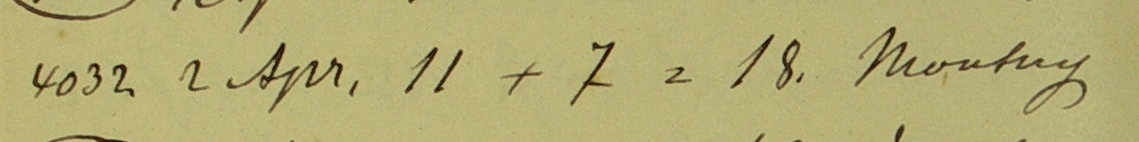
4032 2. April = 11 + 7 = 18. Montag
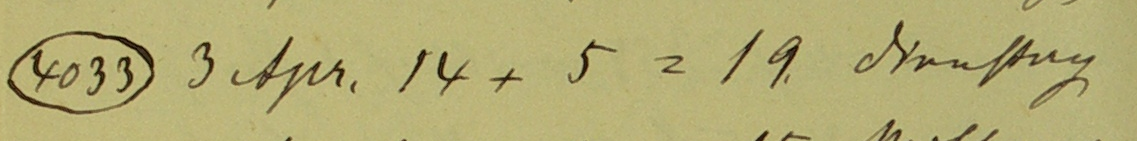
4033 3. April = 14 + 5 = 19. Dienstag
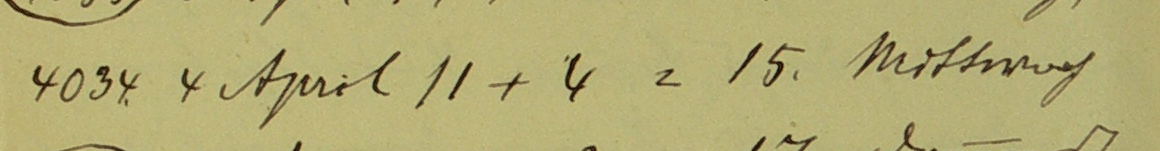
4034 4. April = 11 + 5 = 15. Mittwoch
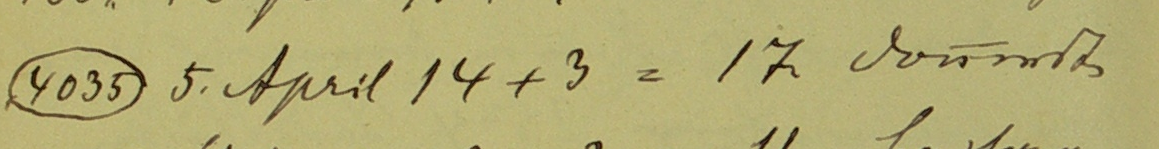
4035 5. April = 14 + 3 = 17. Donnerstag
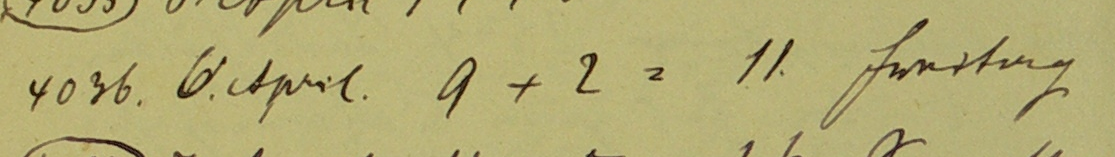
4036 6. April = 9 + 2 = 11. Freitag
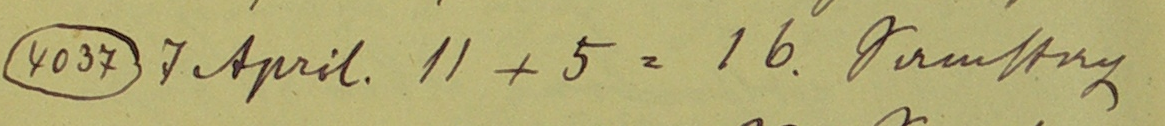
4037 7. April = 11 + 5 = 16. Samstag
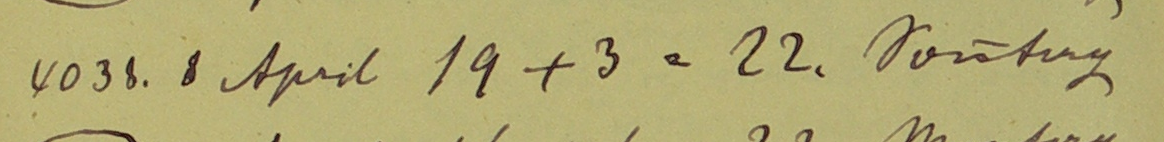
4038 8. April = 19 + 3 = 22. Sonntag
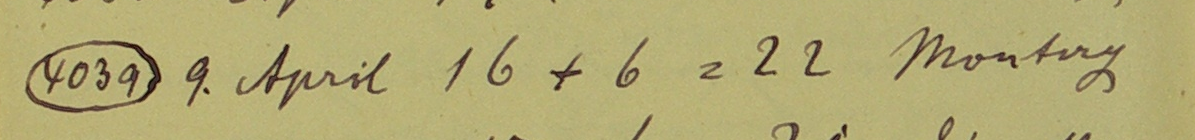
4039 9. April = 16 + 6 = 22. Montag
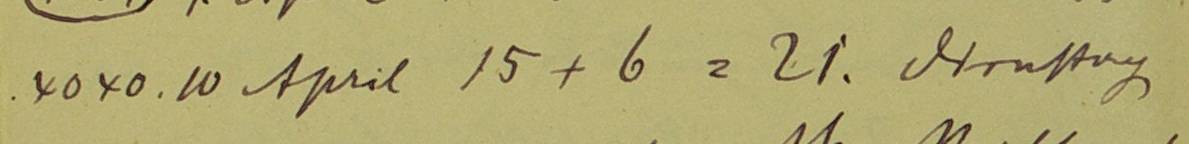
4040 10. April = 15 + 6 = 21. Dienstag
